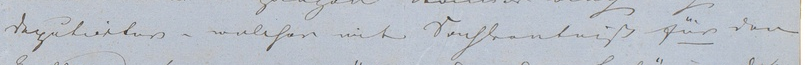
Deputirter – welcher mit Sachkentniß für den
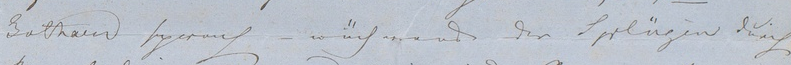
Gothard sprach – während der Splügen durch
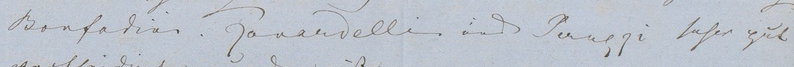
Bonfadini – Zanardelli und Peruzzi sehr gut
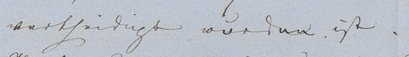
vertheidigt worden ist. –
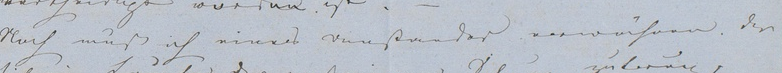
Noch muß ich eines Umstandes erwähnen – der
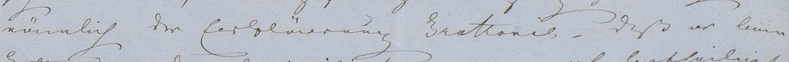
nämlich der Erklärung Grattonis – daß er beim
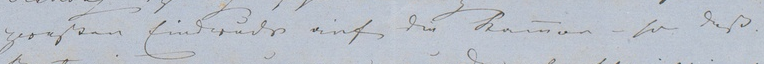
großen Eindruck auf die Kammer – so daß
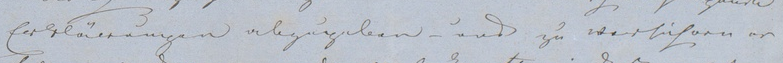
Erklärungen abzugeben – und zu versichern er
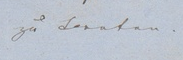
zu treten. –
